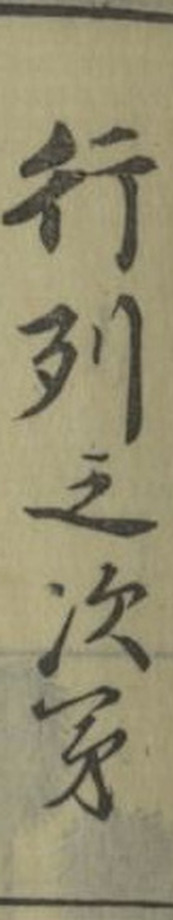行列之次第
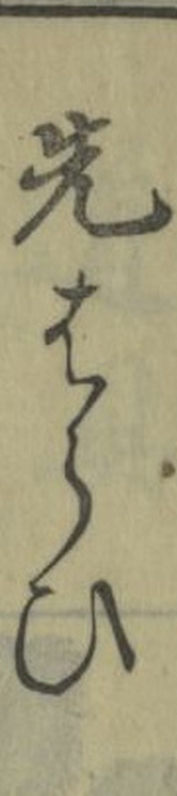先はらひ

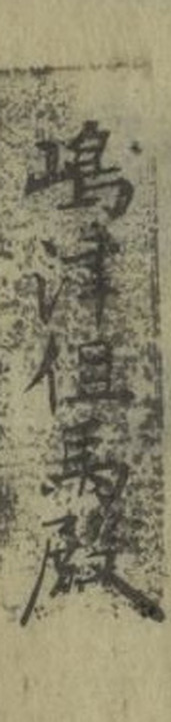島津但馬殿
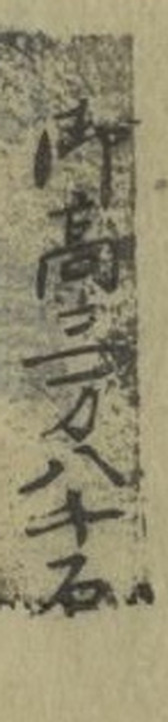御高三万八千石

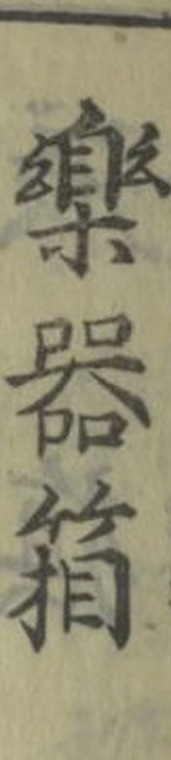樂器箱
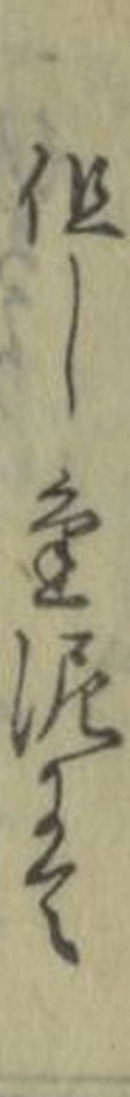但し金泥にて
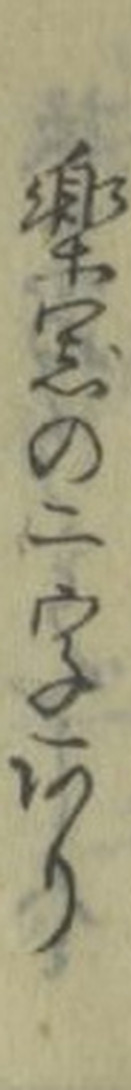樂器の二字あり
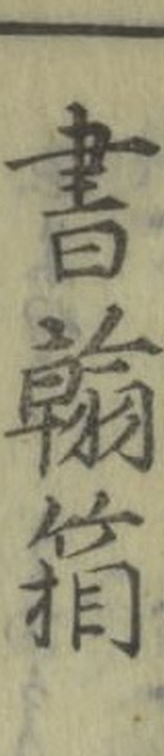書翰箱
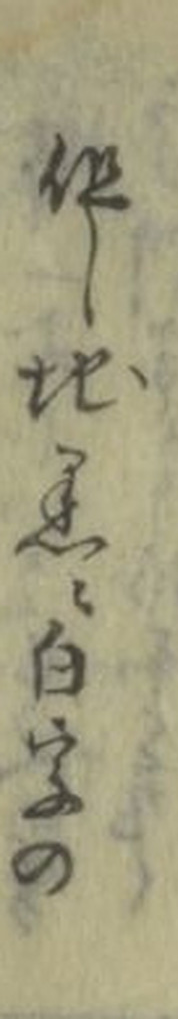但し地黒に白字の
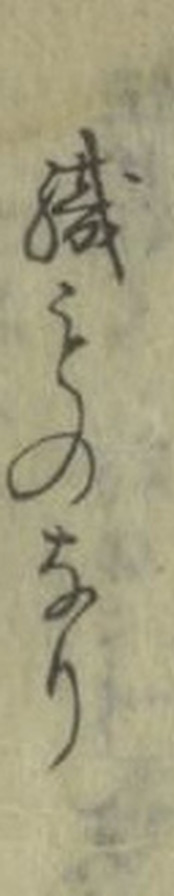織ものなり

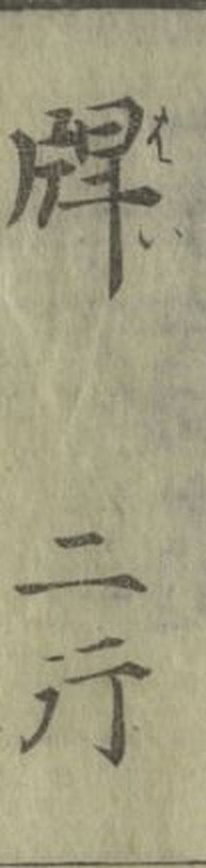牌二行
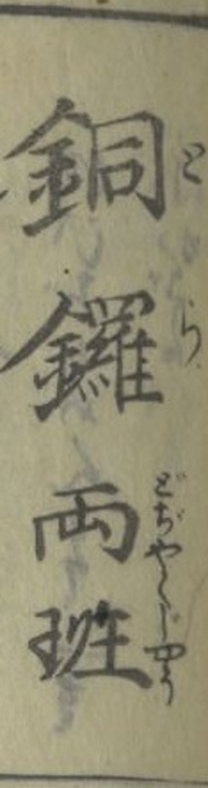銅鑼両班
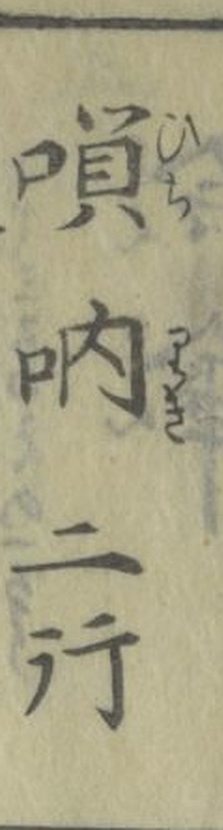嗩吶二行
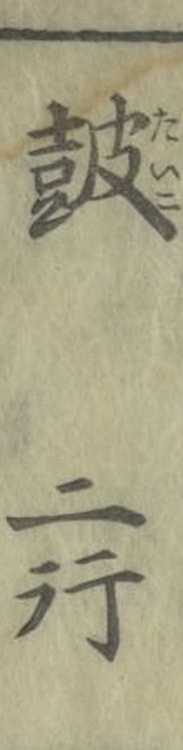鼓二行

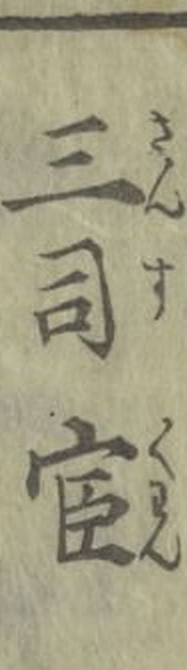三司宦
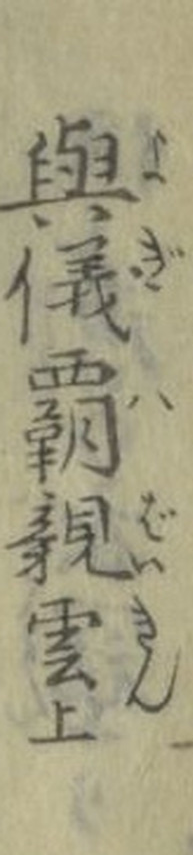與儀覇親雲上
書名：琉球人行列記
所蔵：University of the Ryukyus Library
